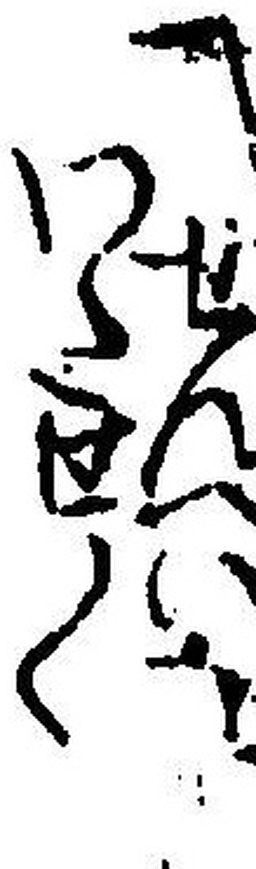わたせ〳〵
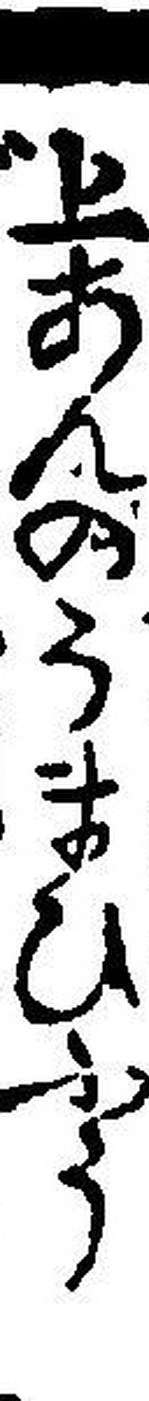上あんのうまひふう
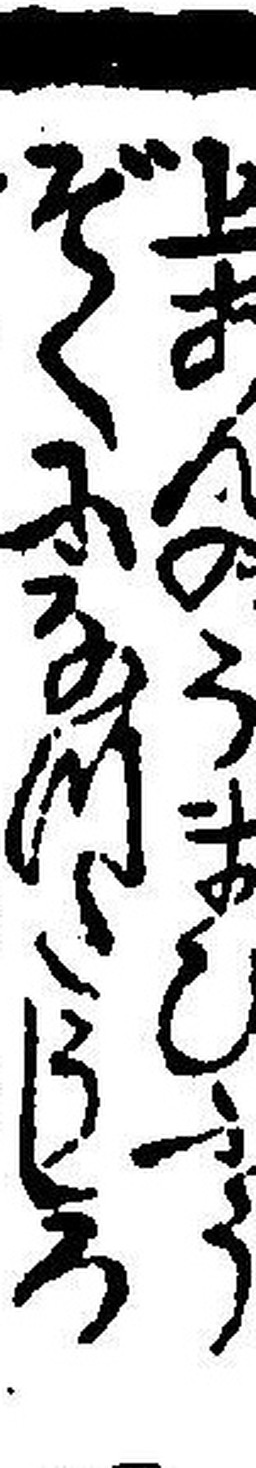ぞくになつたうしろ
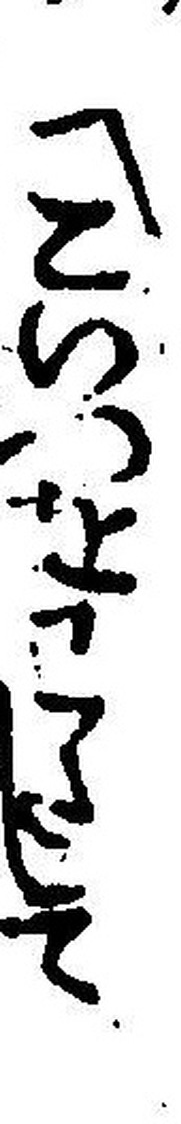〽こいつをわたして
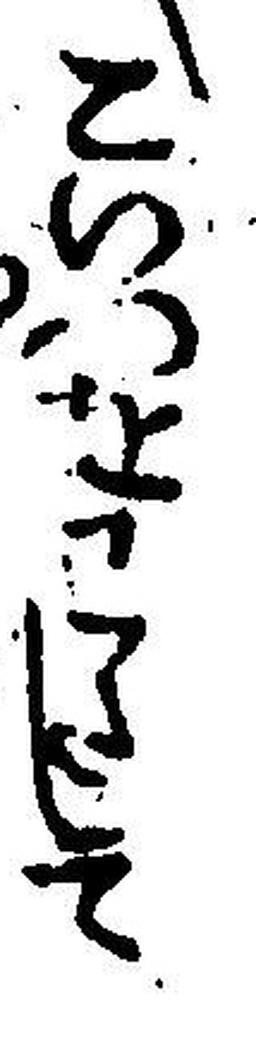〽こいつをわたして
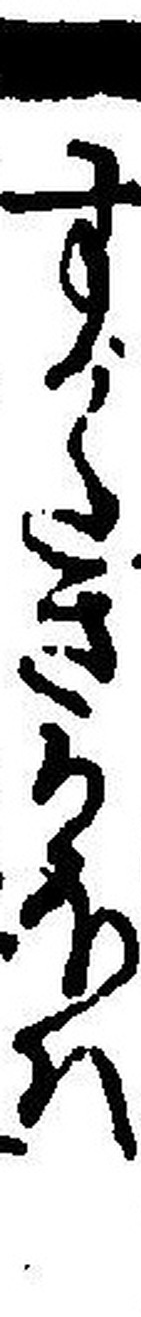すがたさかほは
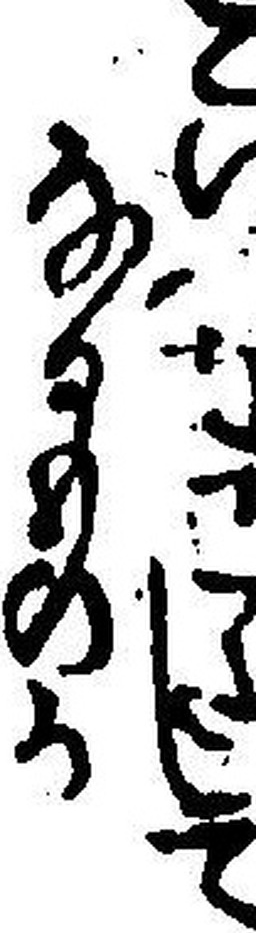なるものか
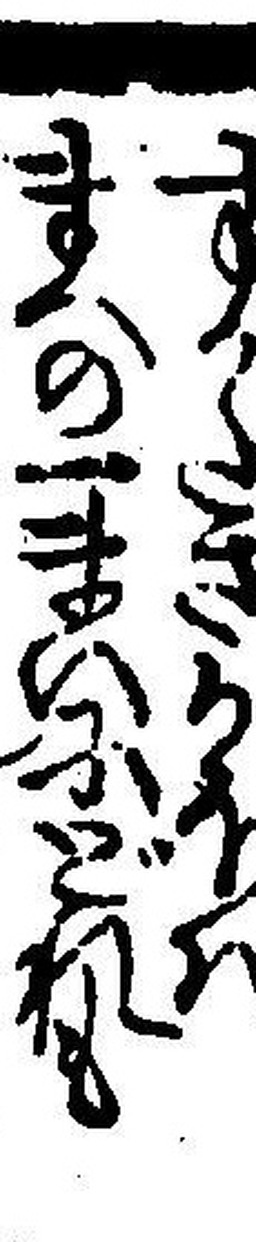まへの一まいにどれも
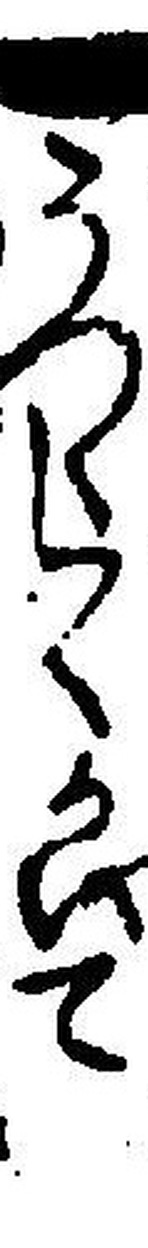うつくしくかいて
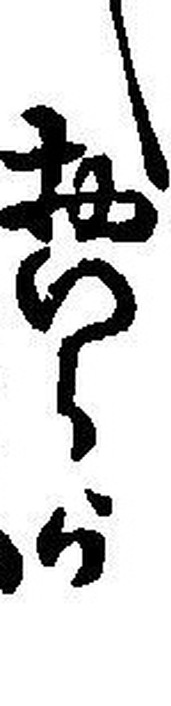〽おいらが
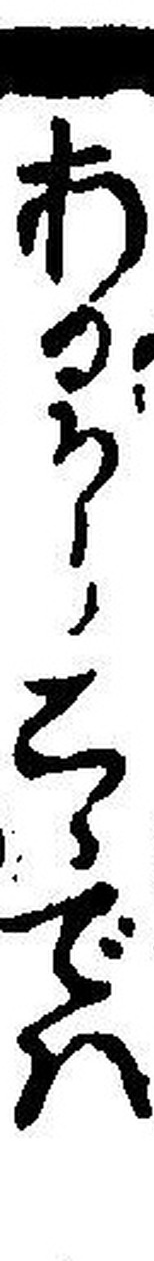あるからこゝでは
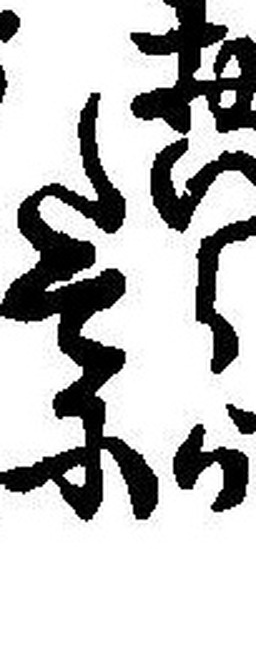たてに
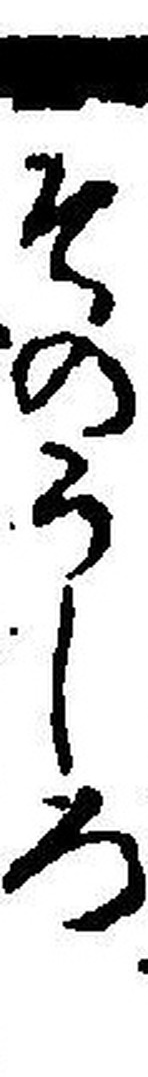そのうしろ
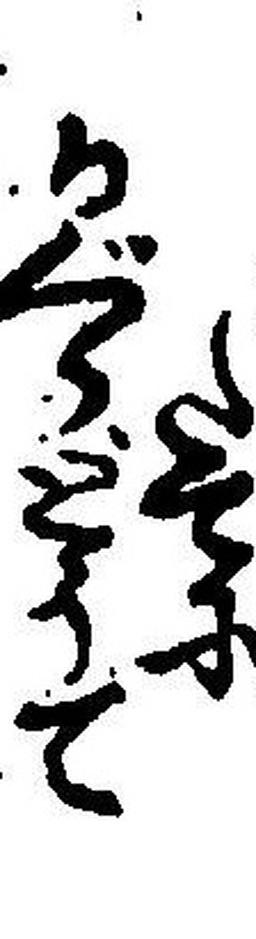かぐらどうて
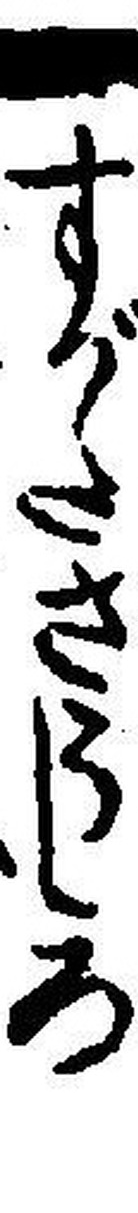すがたさうしろ
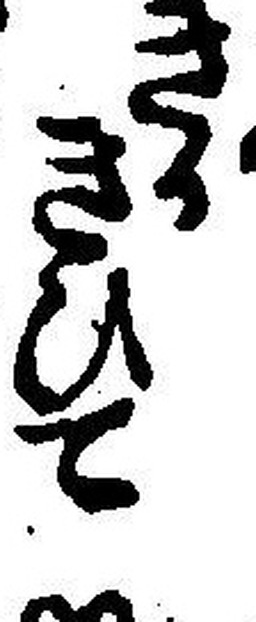きひて
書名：徳若水縁起金性 / 樹下石上作
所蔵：東京大学総合図書館 General Library in the University of Tokyo, JAPAN
